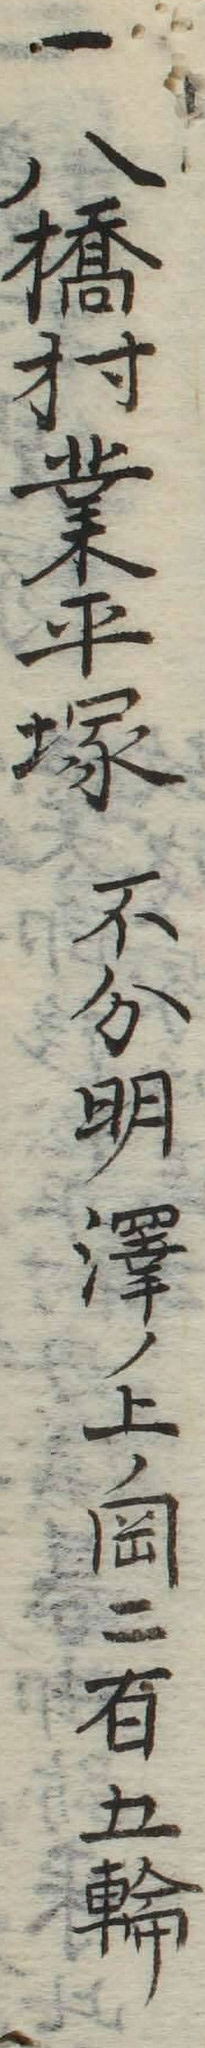一八橋村業平塚不分明沢ノ上ノ岡ニ有五輪

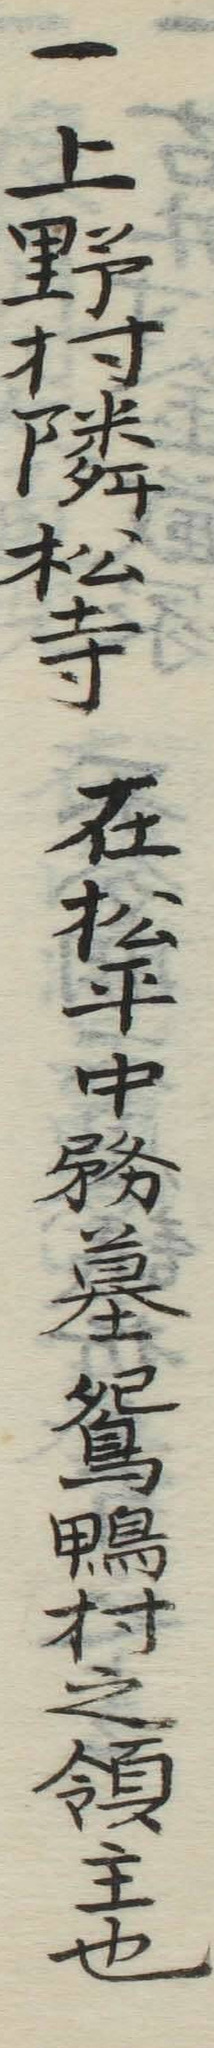一上野村隣松寺在松平中務墓鴛鴨村之領主也
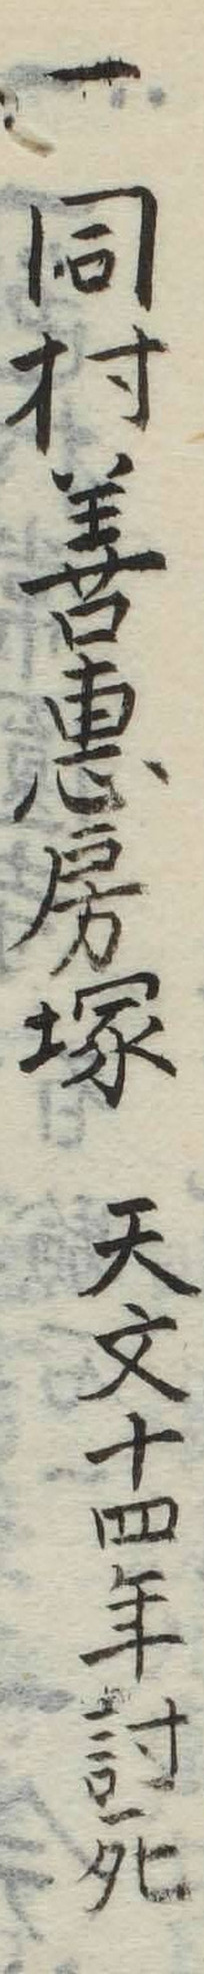一同村善恵房塚天文十四年討死
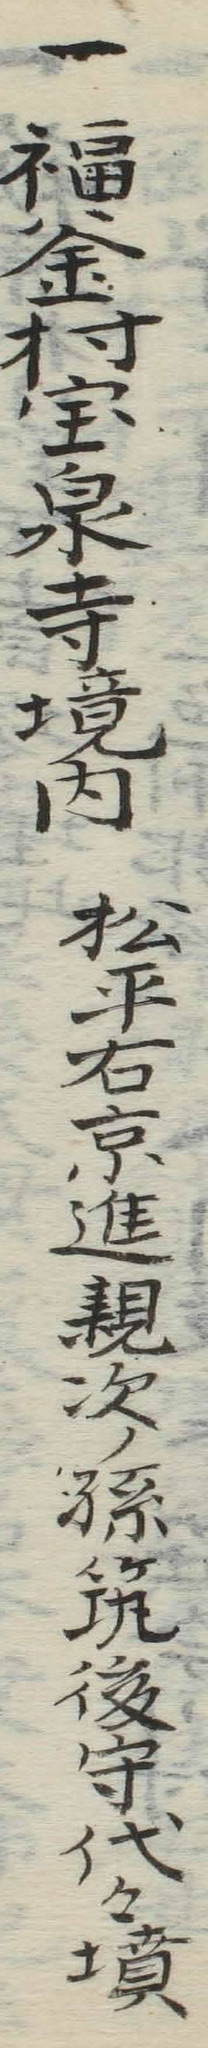一福釜村宝泉寺境内松平右京進親次ノ孫筑後守代々墳
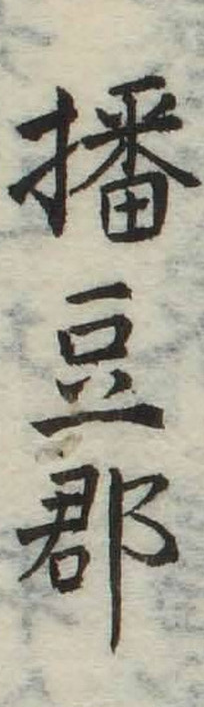播豆郡
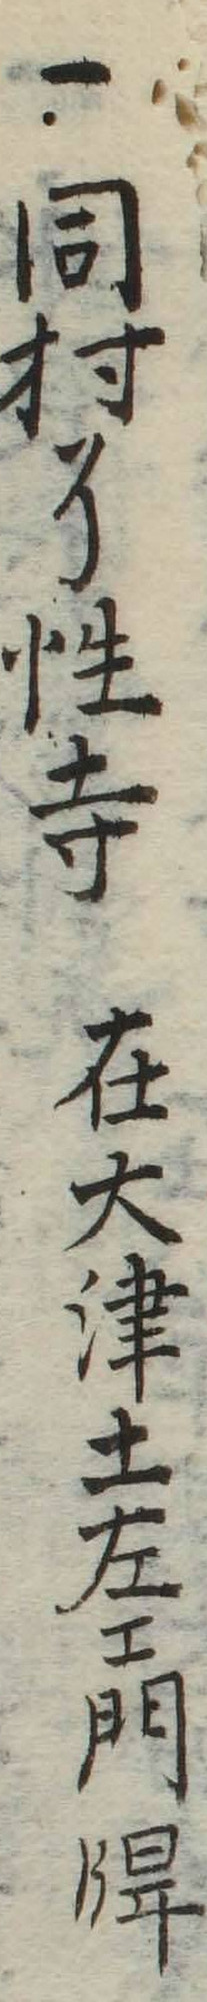一同村了性寺在大津土左エ門牌

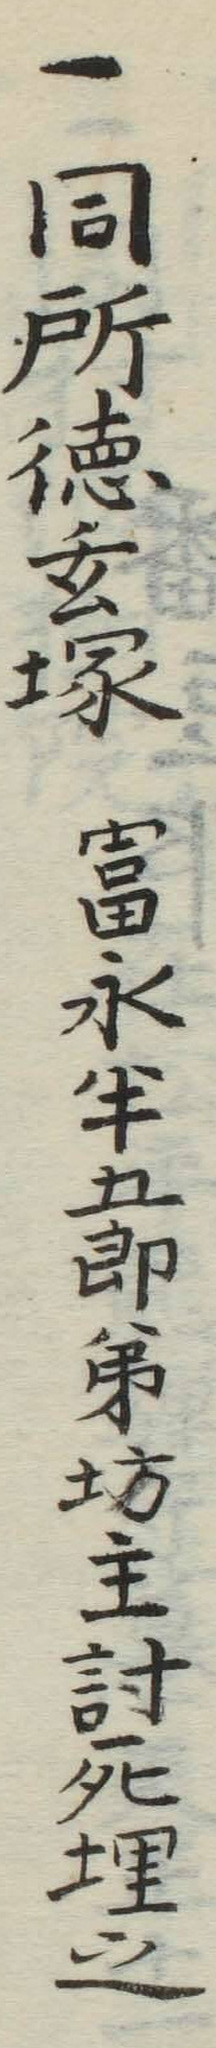一同所徳玄塚富永半五郎弟坊主討死埋之
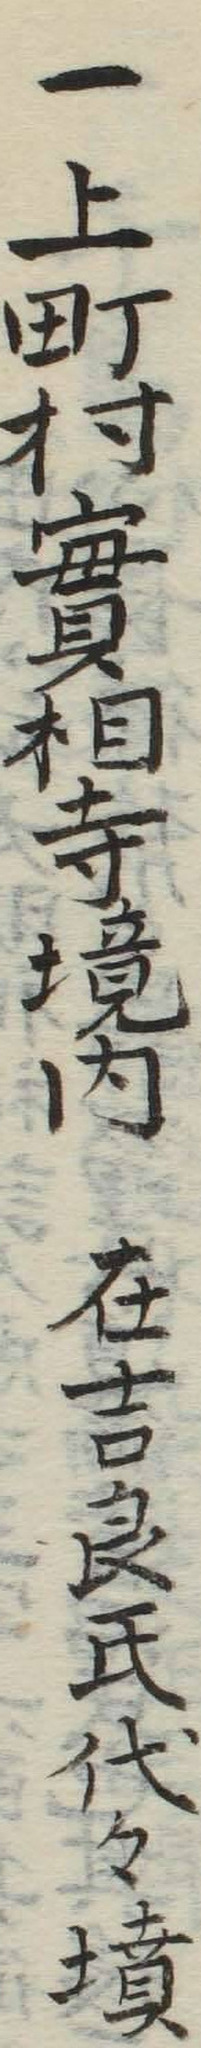一上町村実相寺境内在吉良氏代々墳
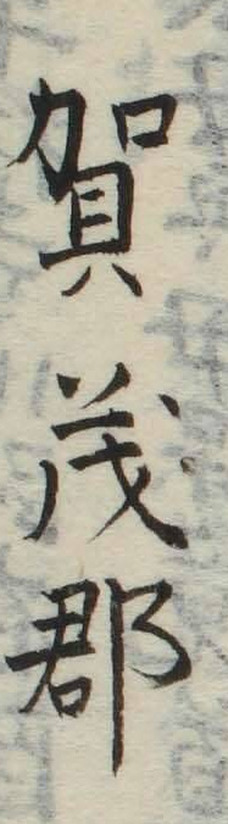賀茂郡

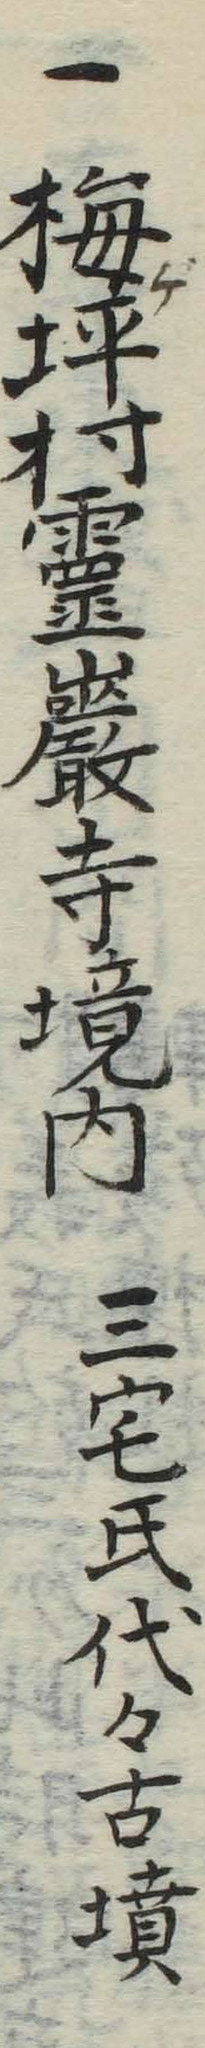一梅ヶ坪村霊巌寺境内三宅氏代々古墳
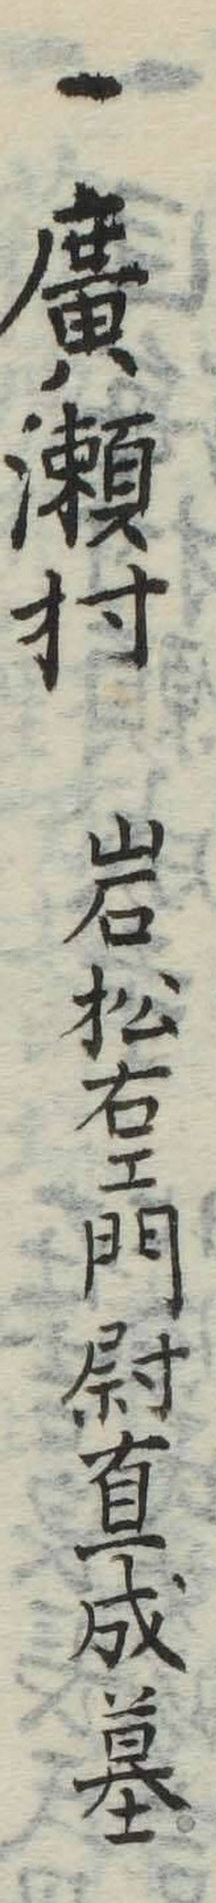一広瀬村岩待右エ門尉真成墓
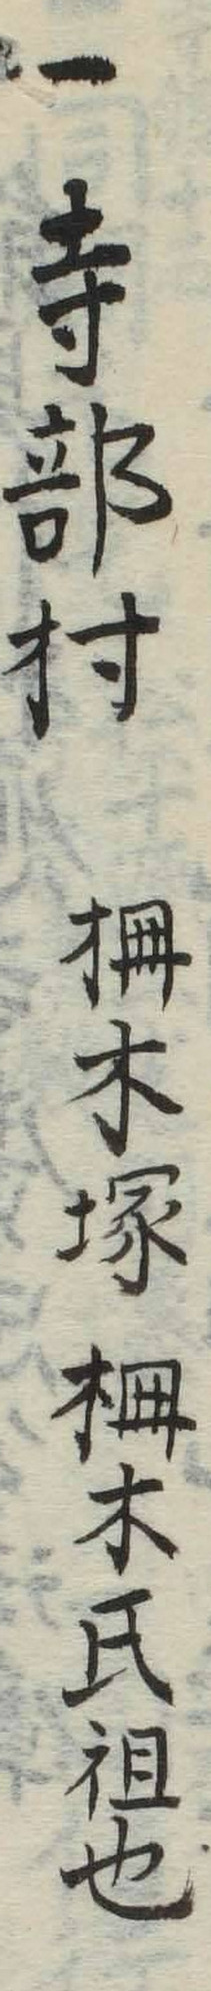一寺部村柵木塚柵木氏祖也
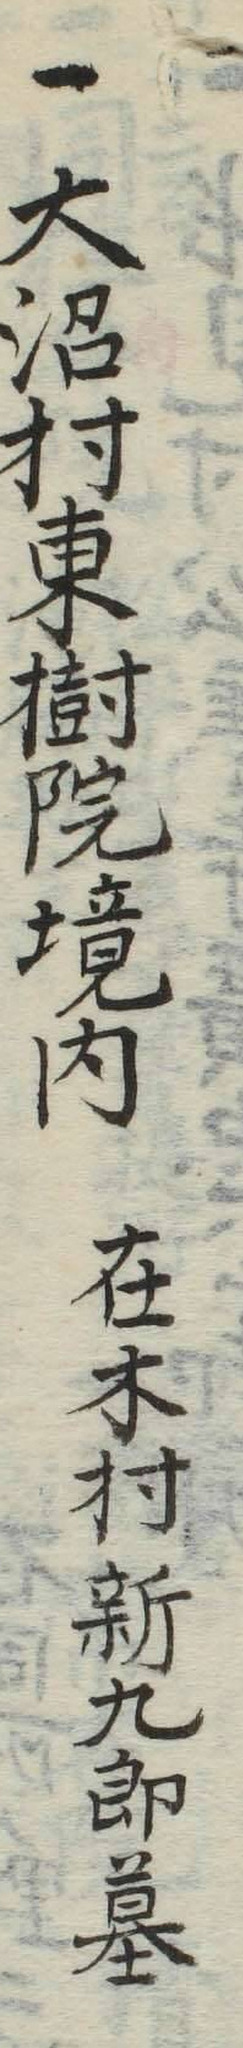一大沼村東樹院境内在木村新九郎墓
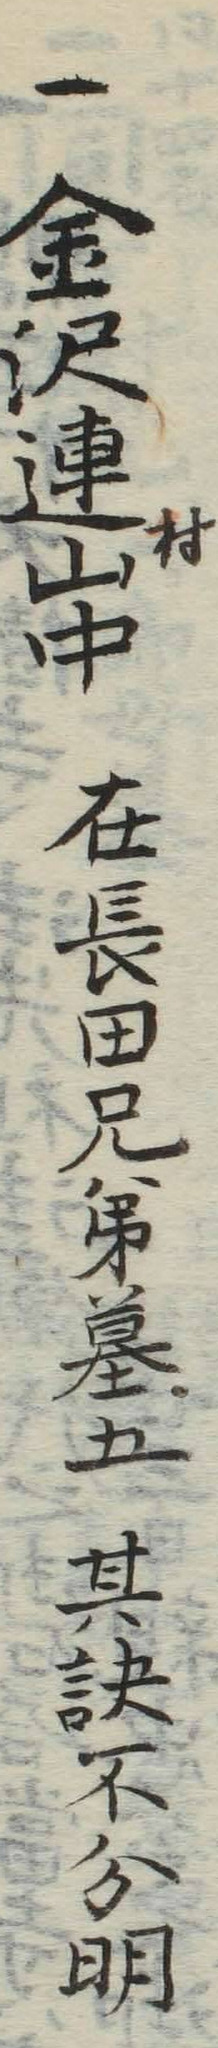一金沢連村山中在長田兄弟墓五其訣不分明
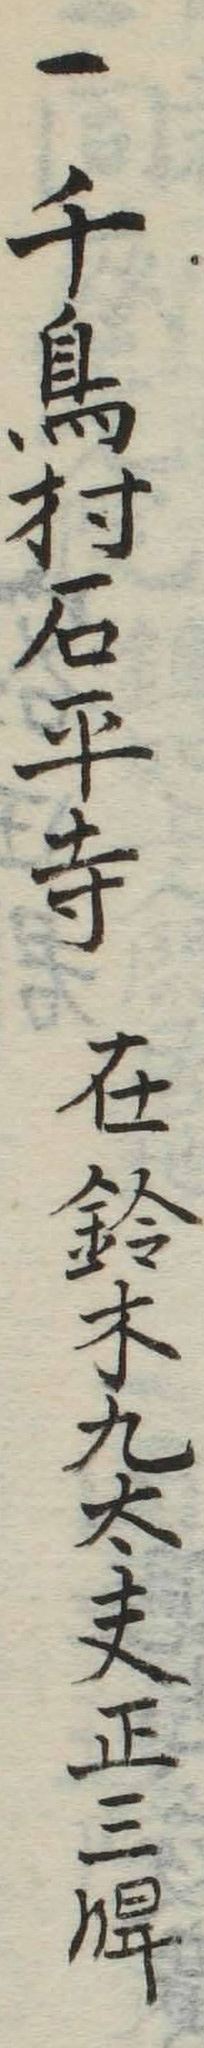一千鳥村石平寺在鈴木九太夫正三牌
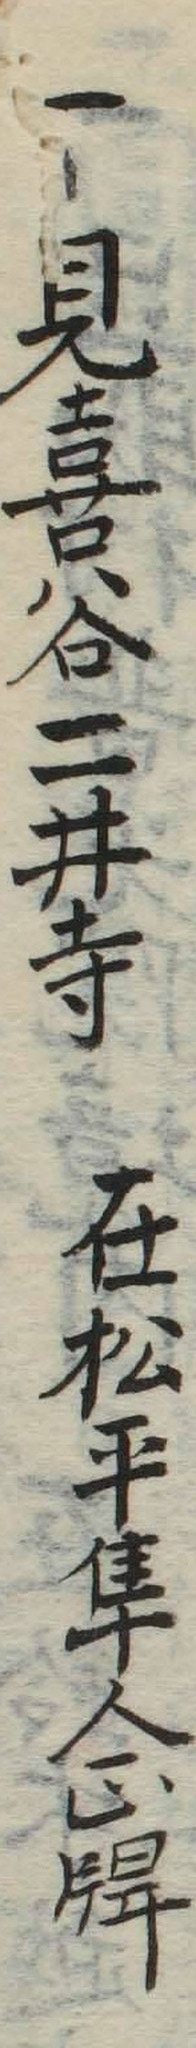一見喜谷二井寺在松平隼人正牌
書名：三河国二葉松
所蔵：国文学研究資料館
